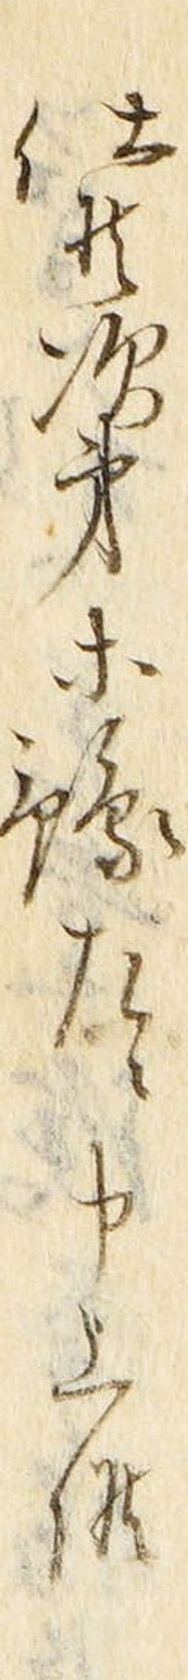仕候次第等？左に申上候
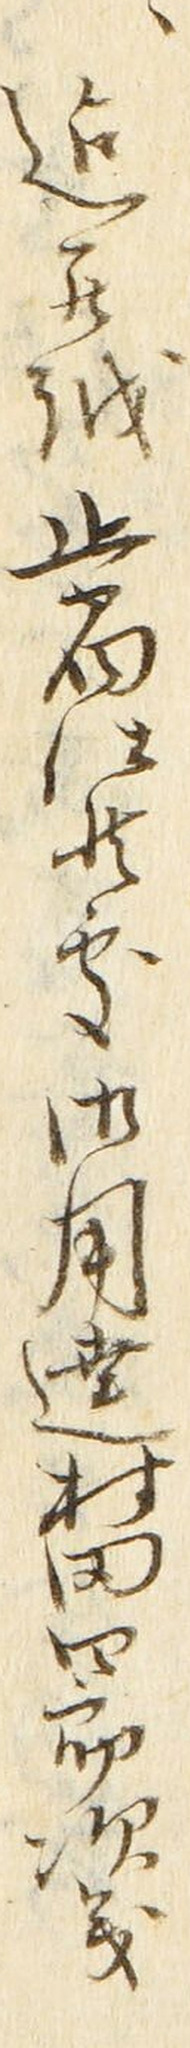迠罷越止宿仕候處御用達村田四郎次義
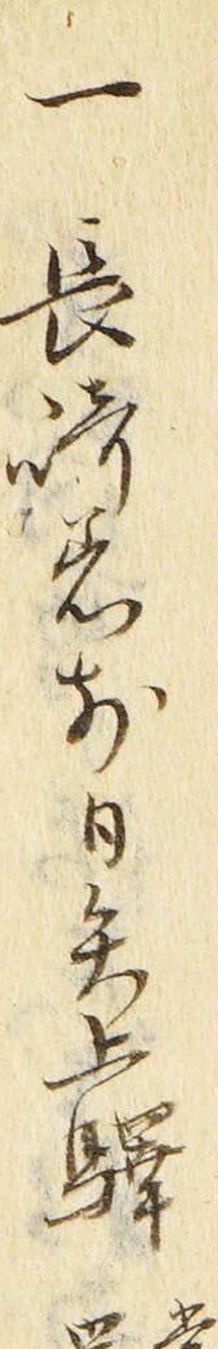一長崎着前日矢上駅
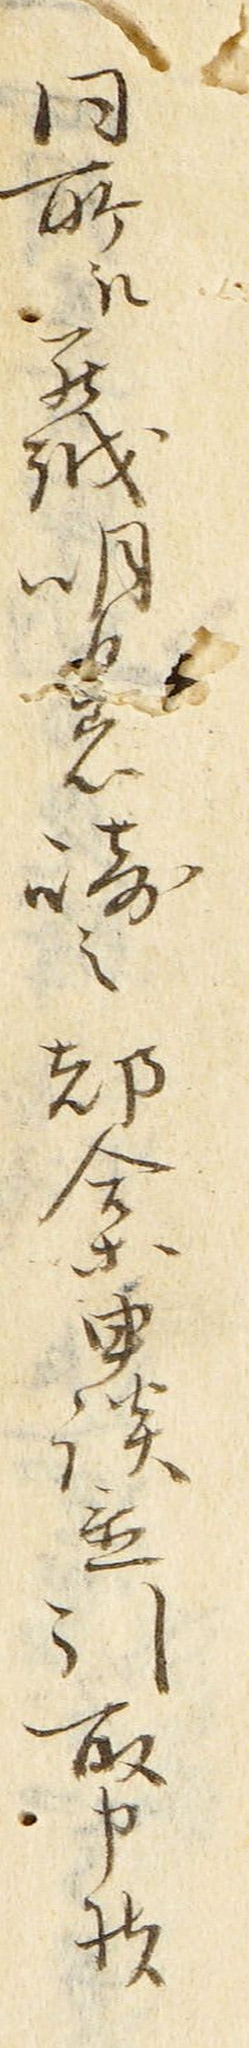同所江罷越明日着崎之都合等由談置引取申候

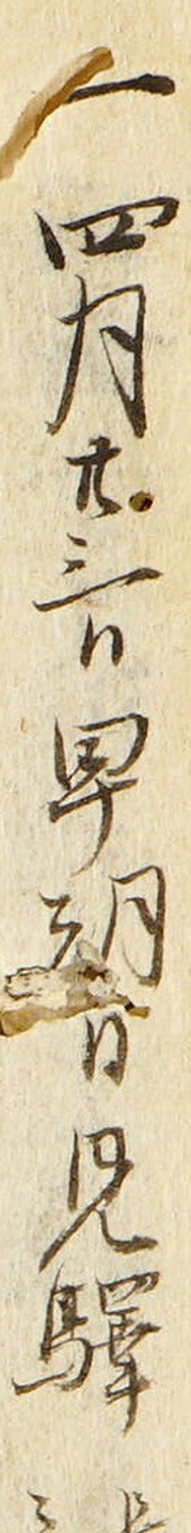一四月廿三日早朝日見駅
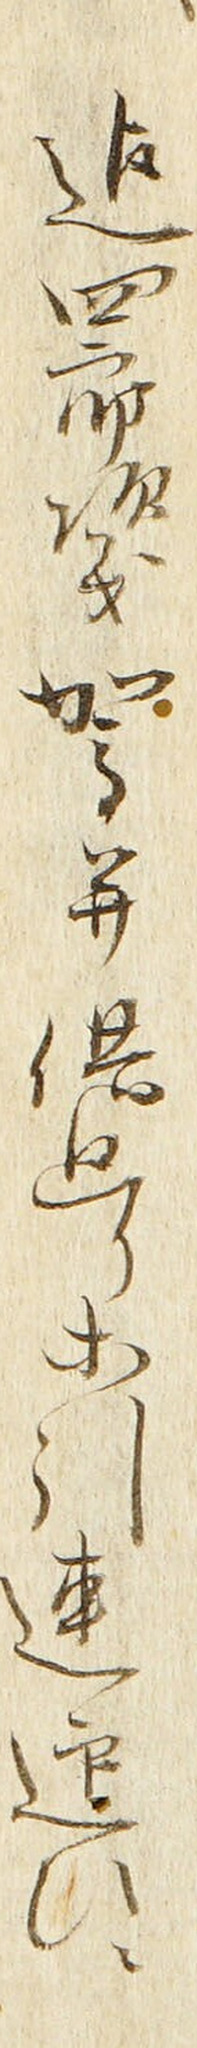迠四郎次義駕並供廻り等引連迎ひに
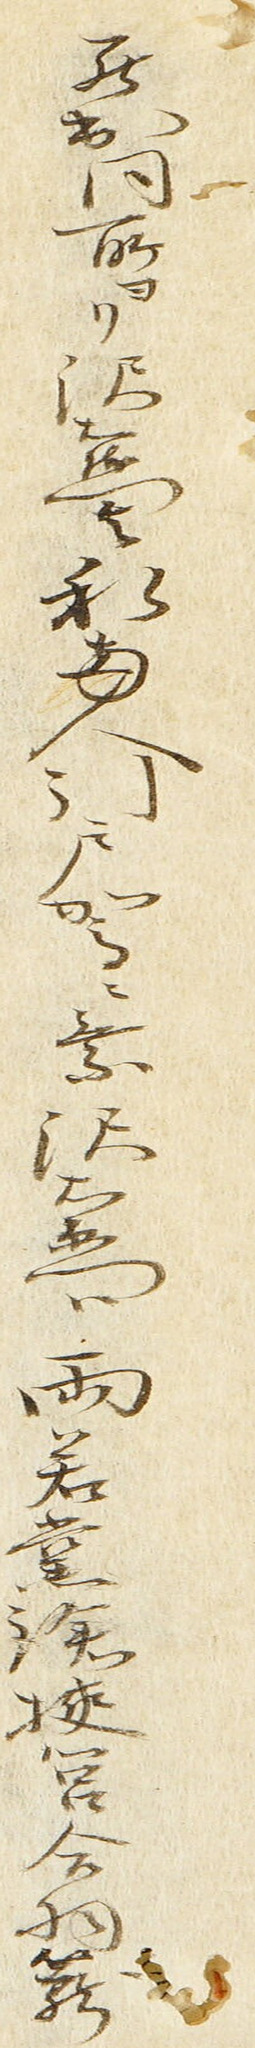罷出同所より沢右衛門と私両人引戸駕に乗沢右衛門は両若党鎗挺筥合羽籠
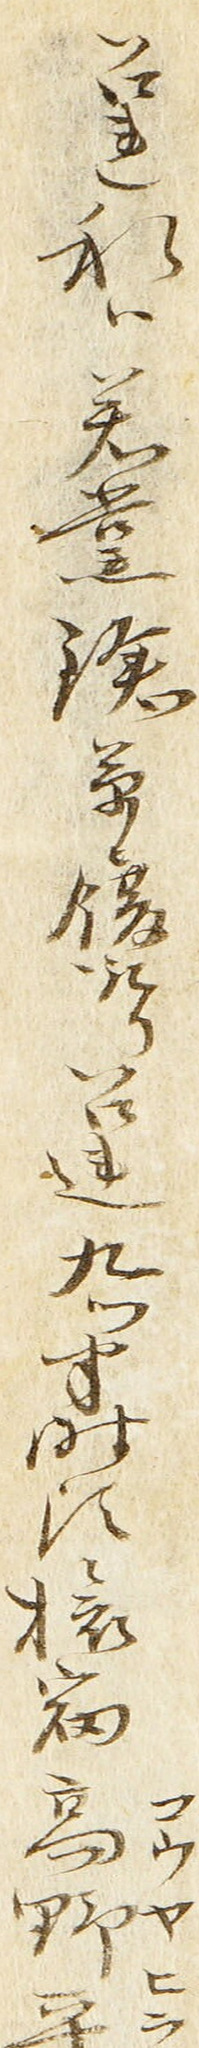召連私は若党鎗草と？取り召連九ツ半頃に旅宿高野平
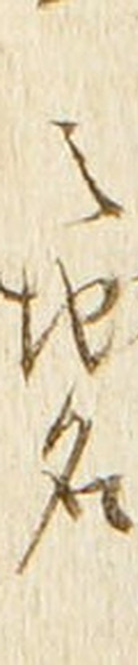之地名
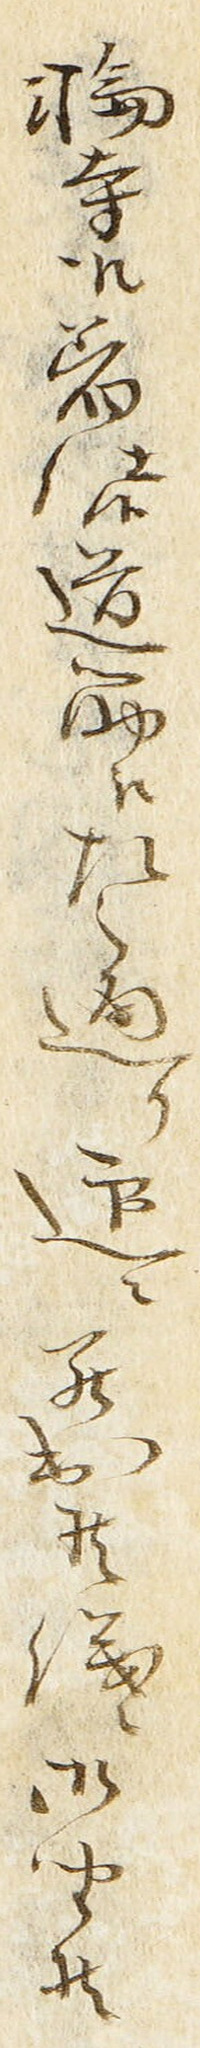論寺江着仕候道筋江たた通り追々罷出候儀に御座候
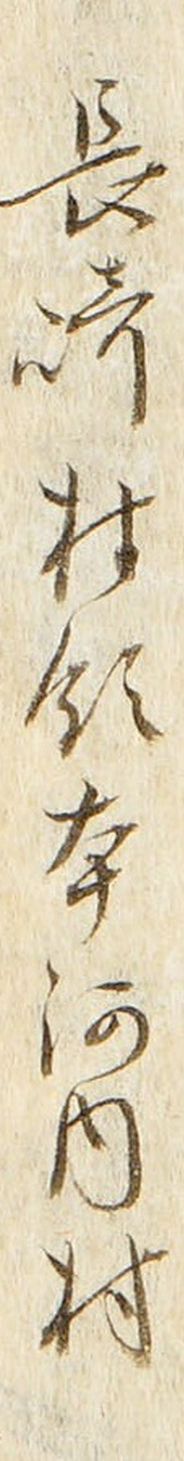長崎村領本河内村
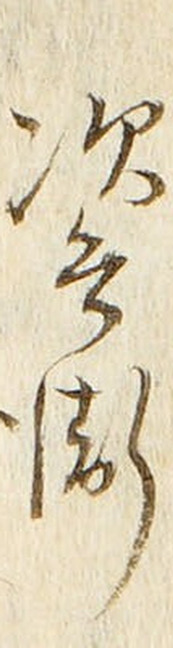次兵衛
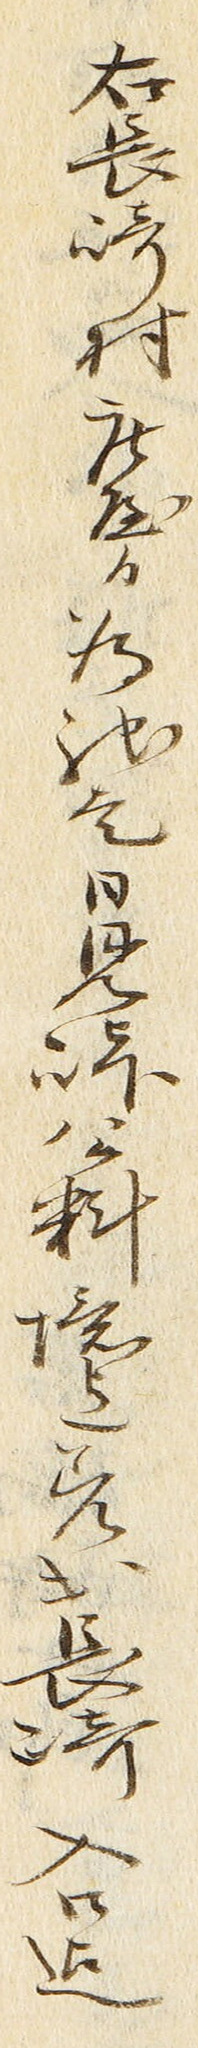右長崎村庄屋候為馳走日見峠公料境迠差出長崎入口迠
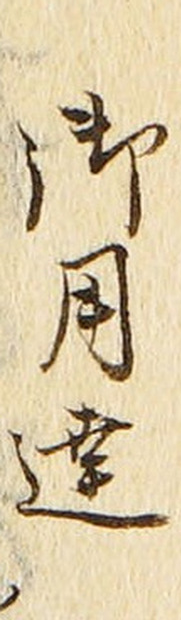御用達
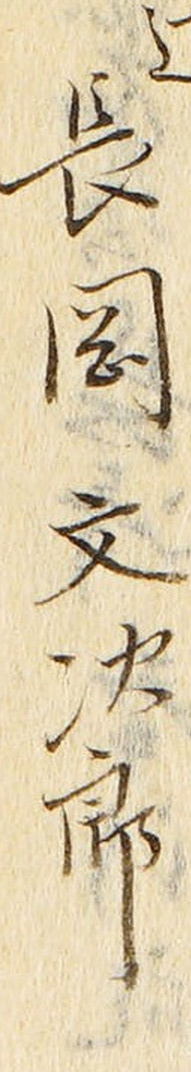長岡文次郎
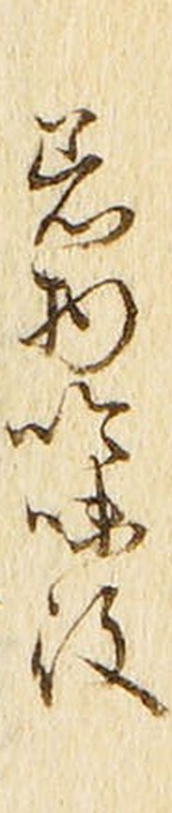着物吟味役
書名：長崎漂流記
